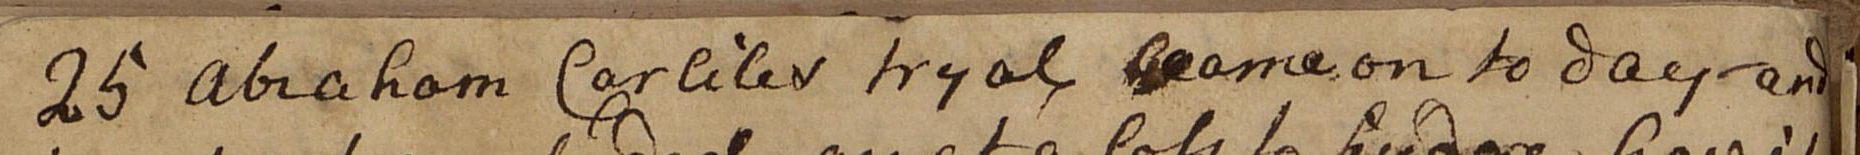25 Abraham Carliles tryal, came on to day- and
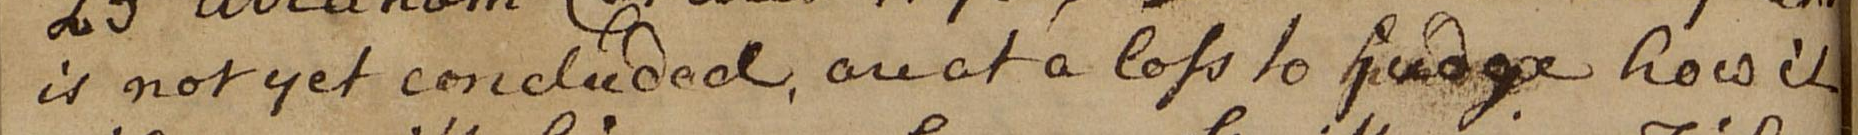is not yet concluded, are at a loss to judge how it
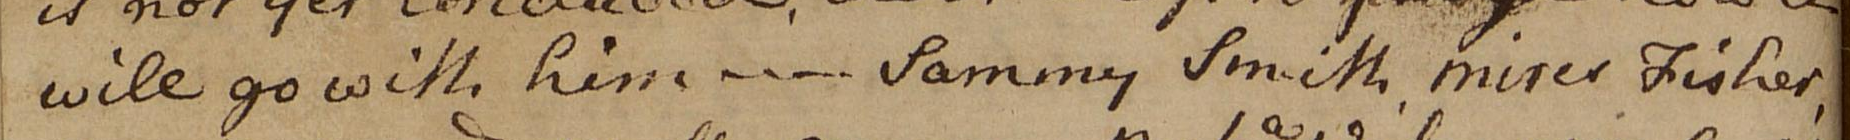will go with him- Sammy Smith mises Fisher,
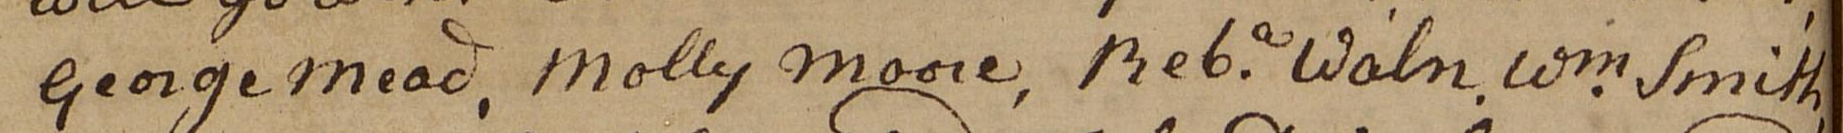George Mead, Molly Moore, Reb^a. Waln, W^m Smith,
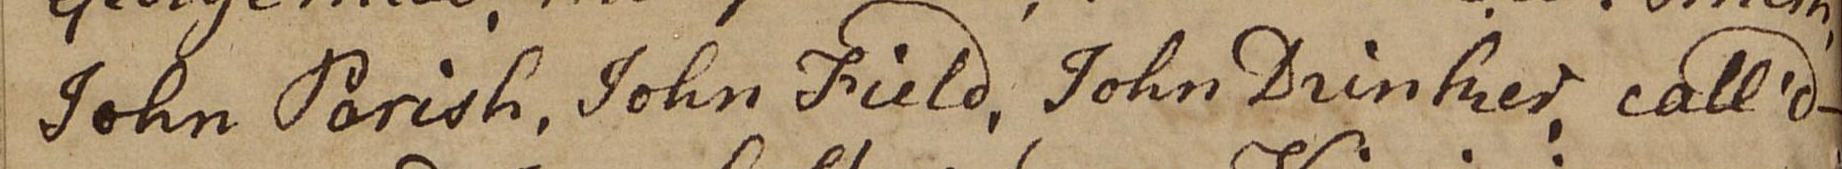John Parish, John Field, John Drinker, call'd-
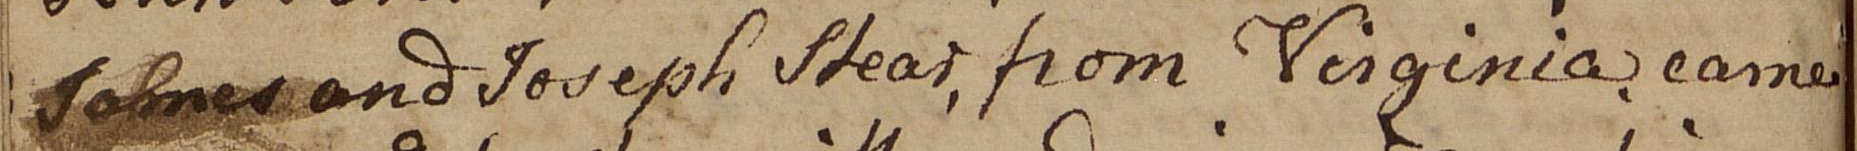[Johnes] and Joseph Stear, from Virginia came
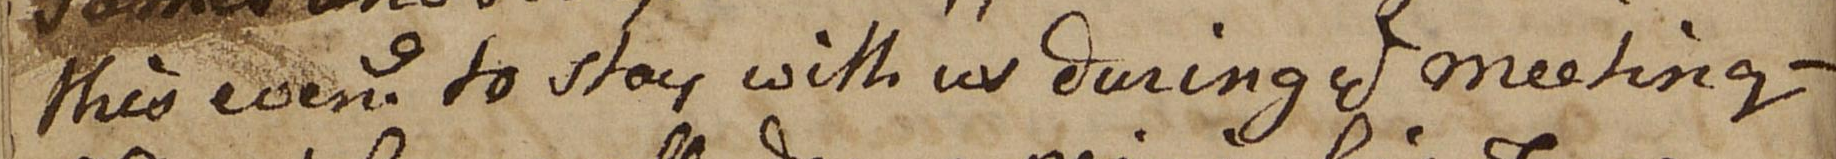this even^g. to stay with us during y^e meeting-
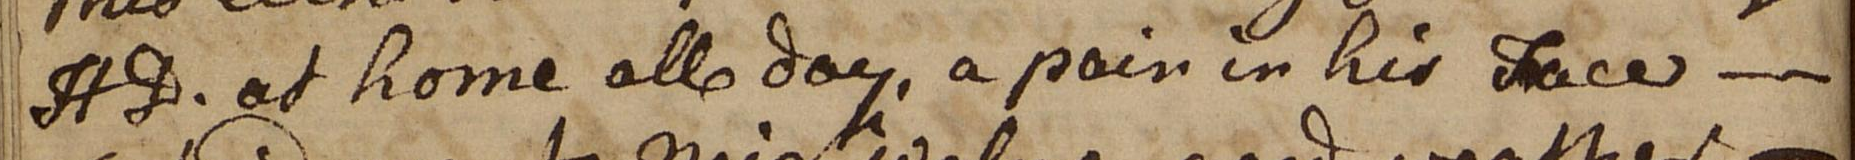H D. at home all day, a pain in his Face-
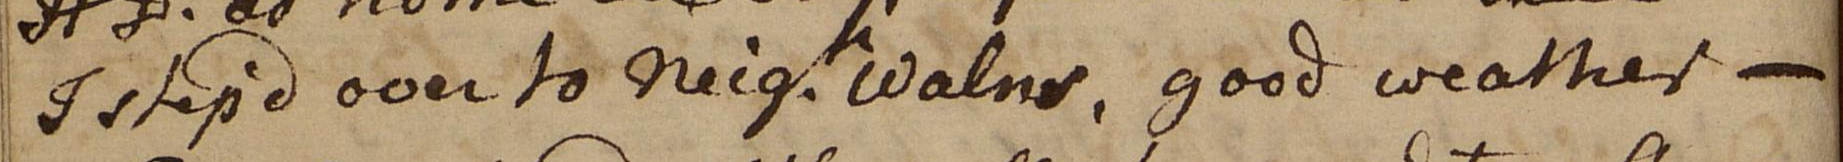I step'd over to Neig^r. Walns, good weather-
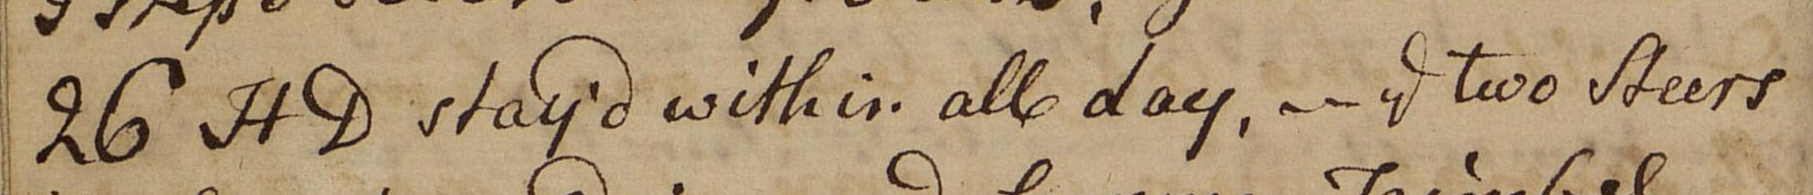26 HD stay'd within all day- y^e two Steers
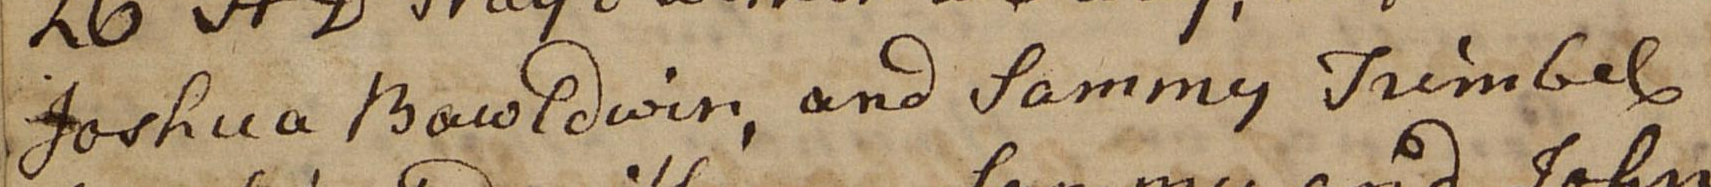Joshua Bawldwin, and Sammy Trimbel
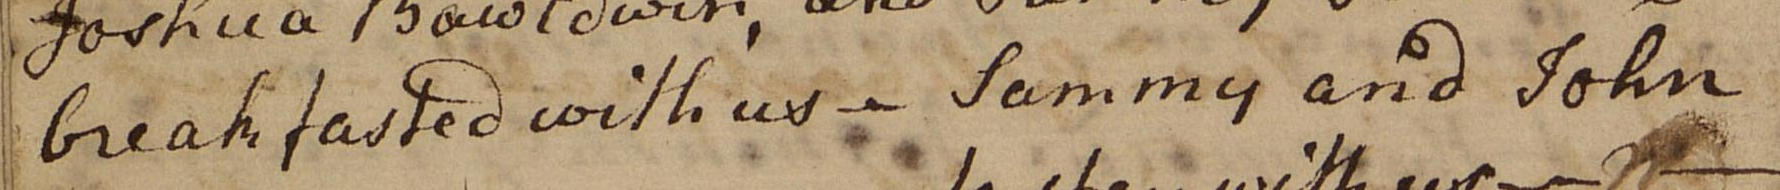breakfasted with us- Sammy and John
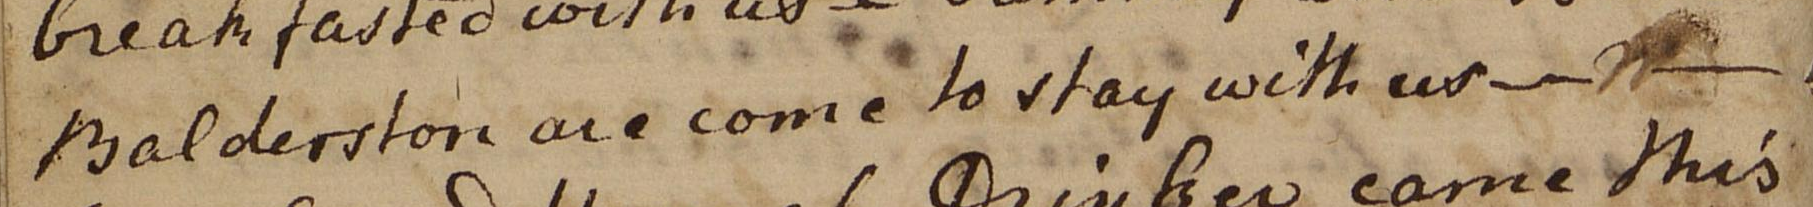Balderston are come to stay with us- -
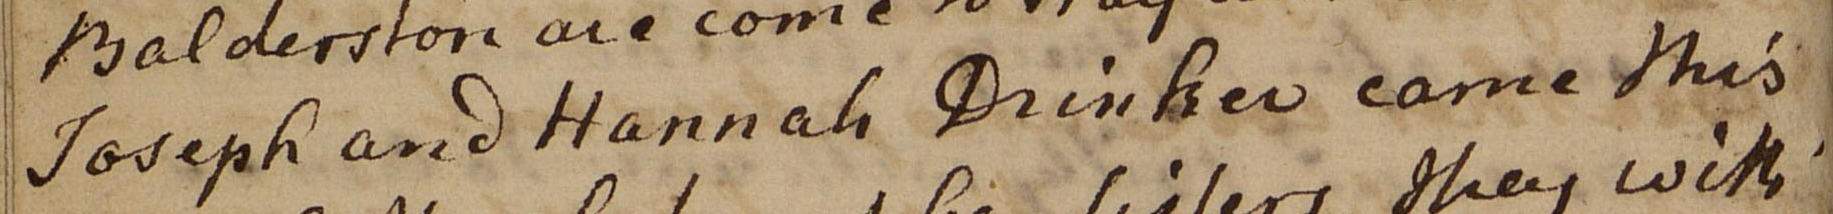Joseph and Hannah Drinker came this
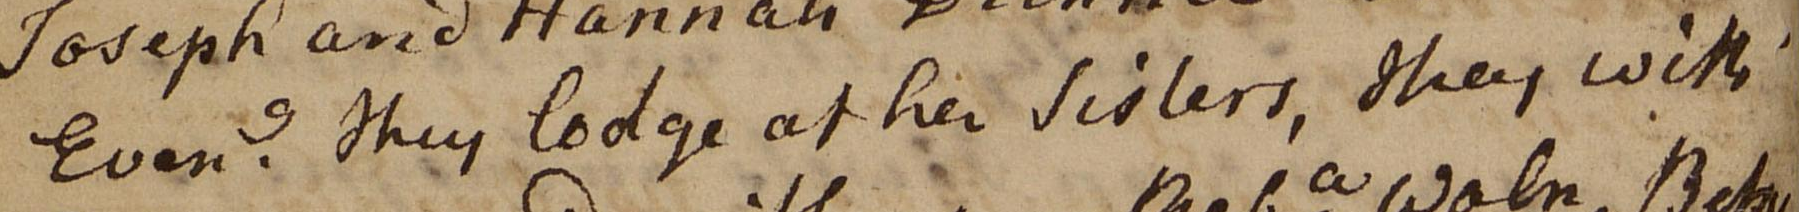Even.^g they lodge at her Sisters, they with
